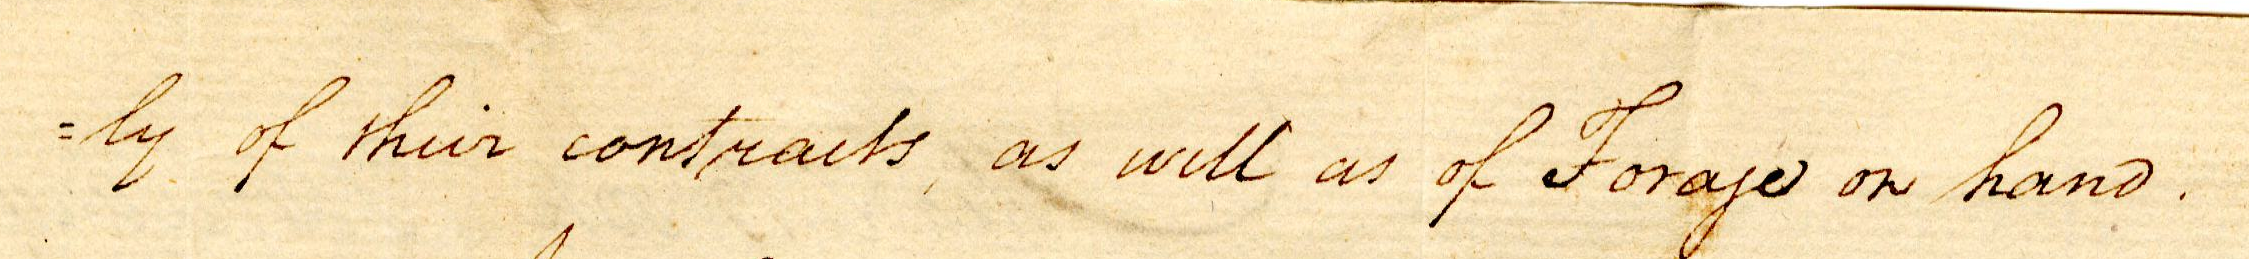-ly of their contracts, as well as of Forage on hand.
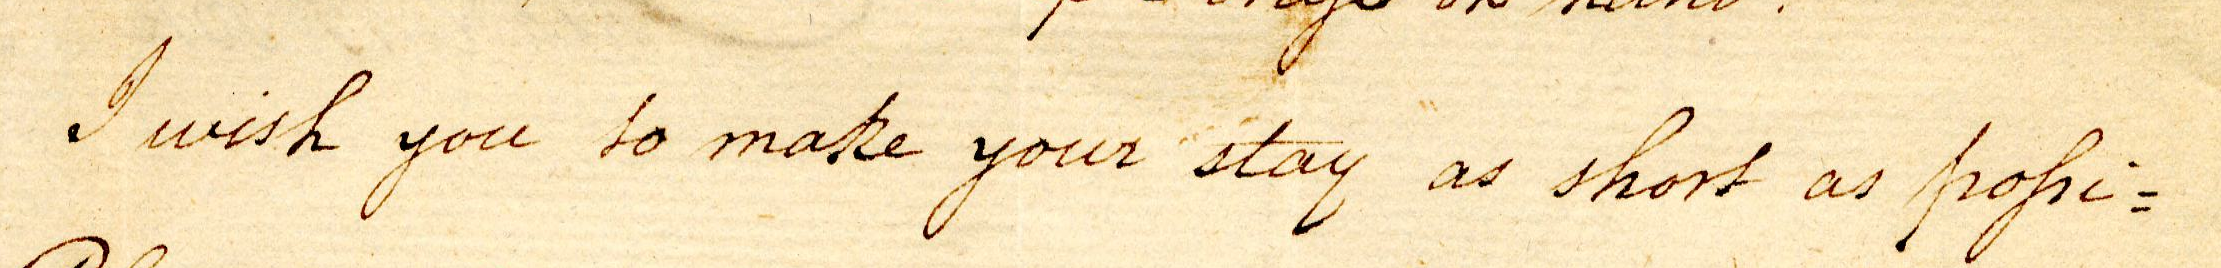I wish you to make your stay as short as possi-
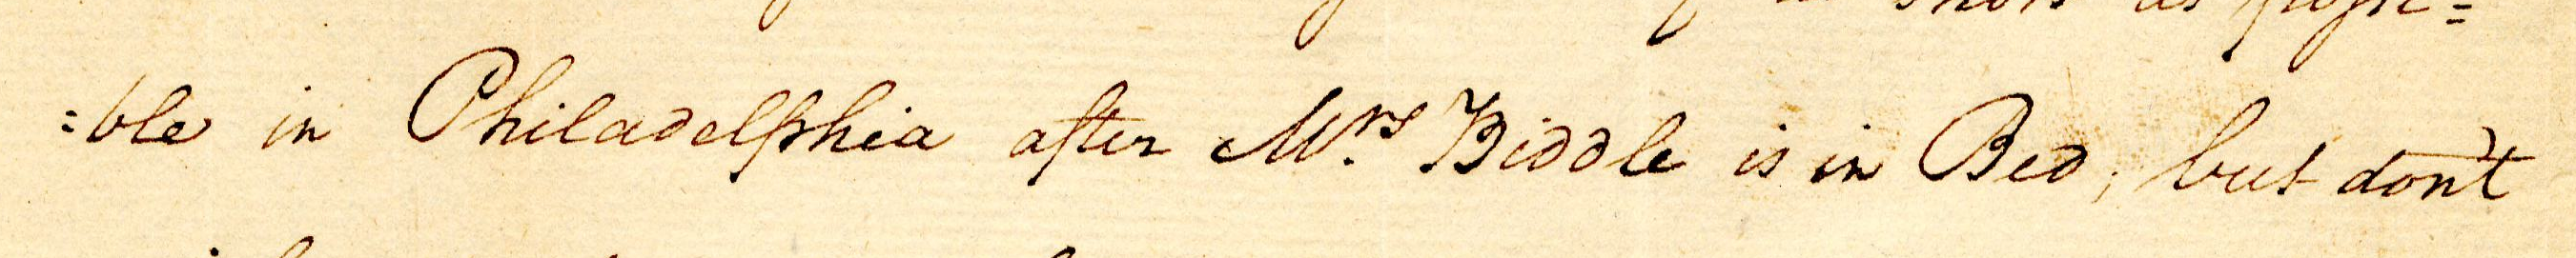-ble in Philadelphia after M^rs. Biddle is in Bed; but don't
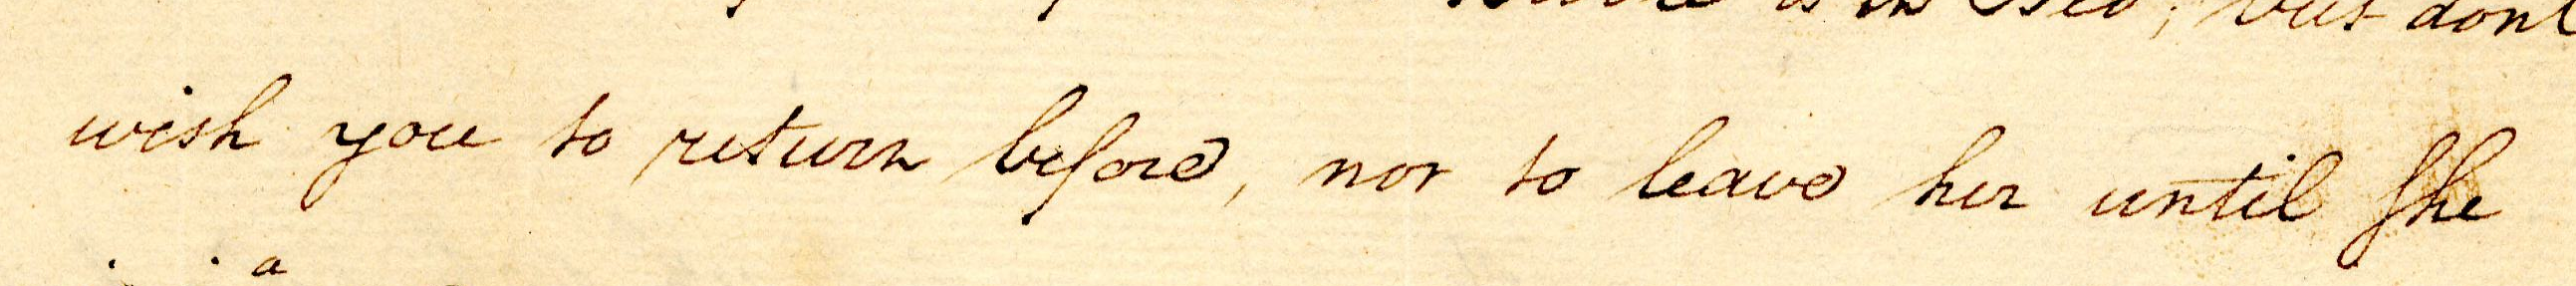wish you to return before, nor to leave her until she
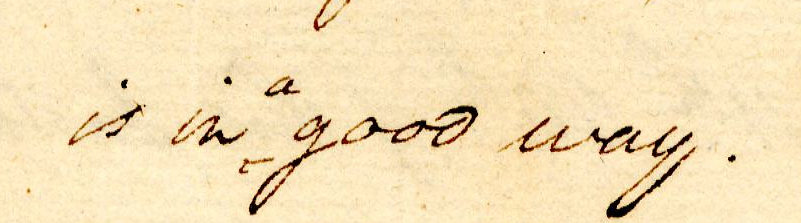is in ^a good way.
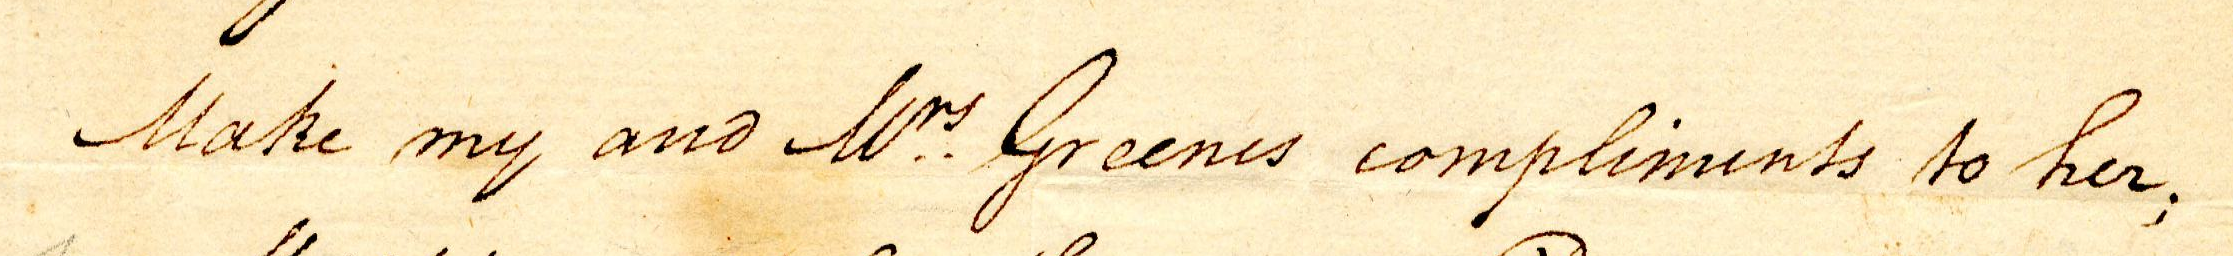Make my and M^rs. Greens compliments to her;
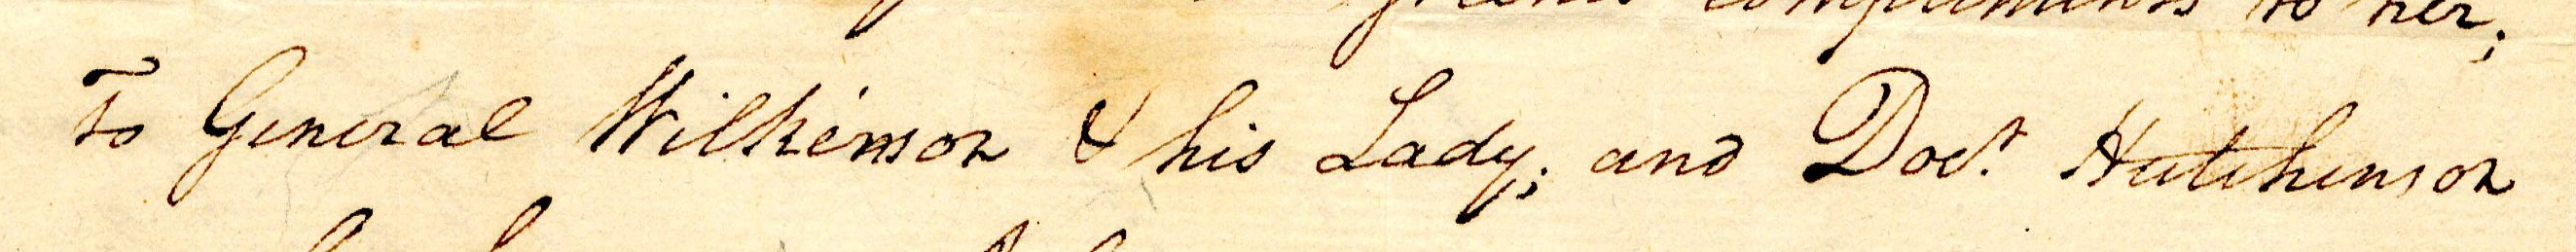To General Wilkinson & his Lady; and Doc^r. Hutchinson
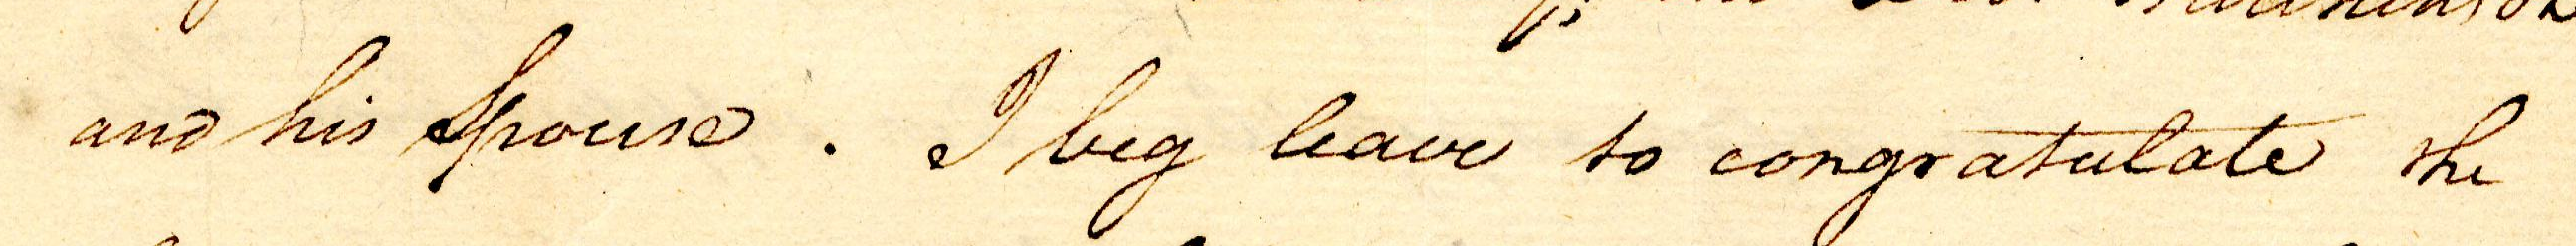and his Spouse. I beg leave to congratulate the
